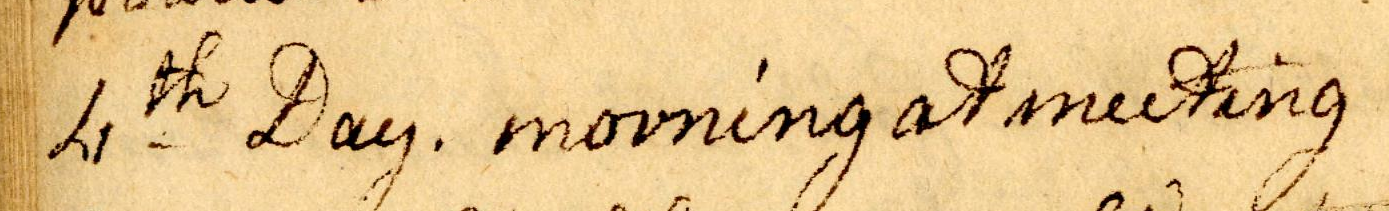4^th Day. morning at meeting
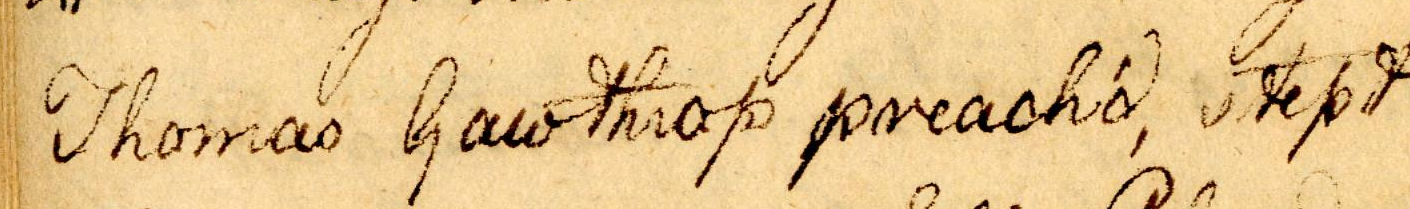Thomas Gawthrop preach'd, stept
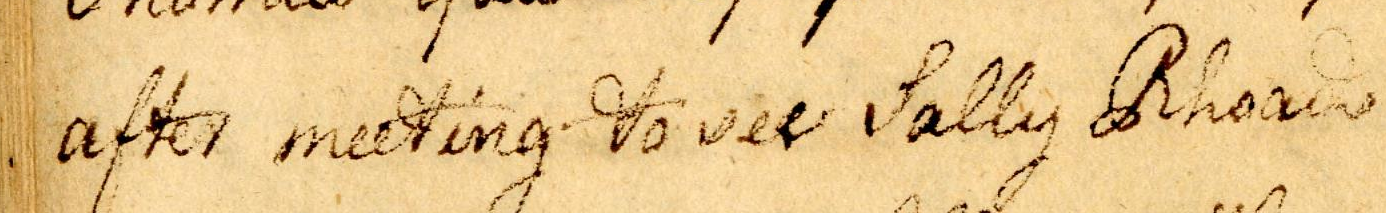after meeting to see Sally Rhoads
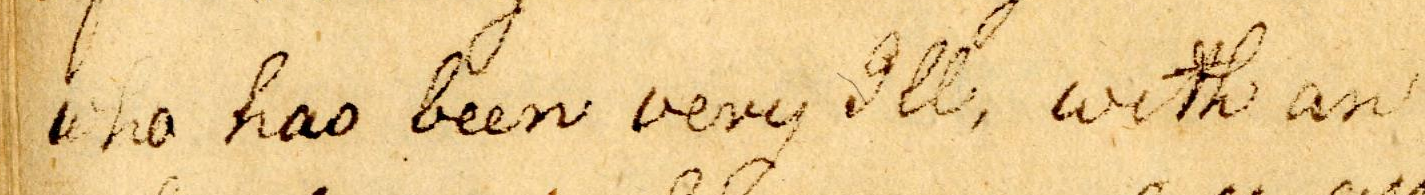who has been very Ill, with an
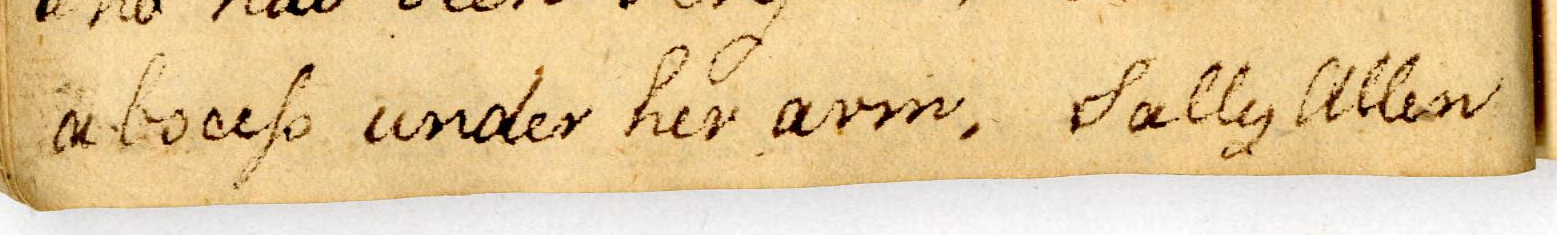abscess under her arm, Sally Allen
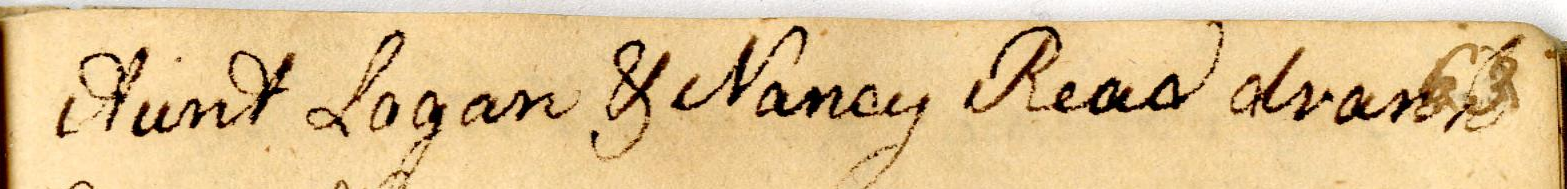Aunt Logan & Nancy Read drank
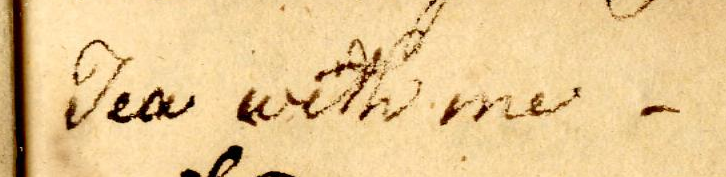Tea with me -
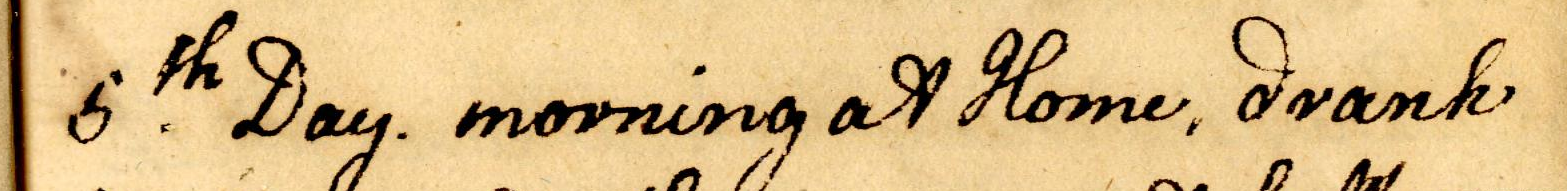5^th Day. morning at Home, drank
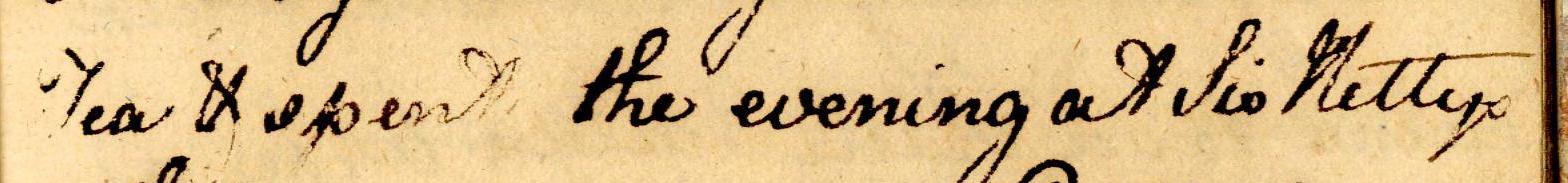Tea & spent the evening at Sis Hettys
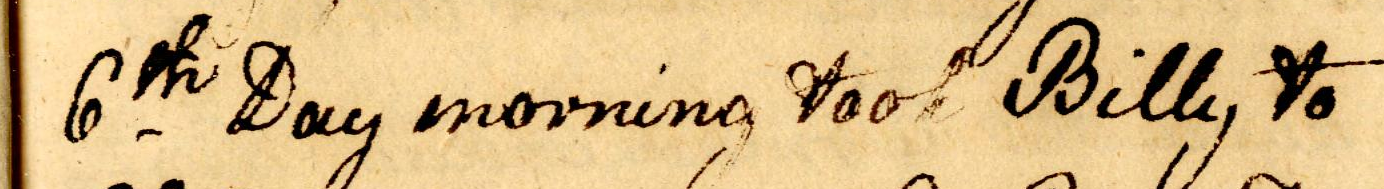6^th Day morning took Billy to
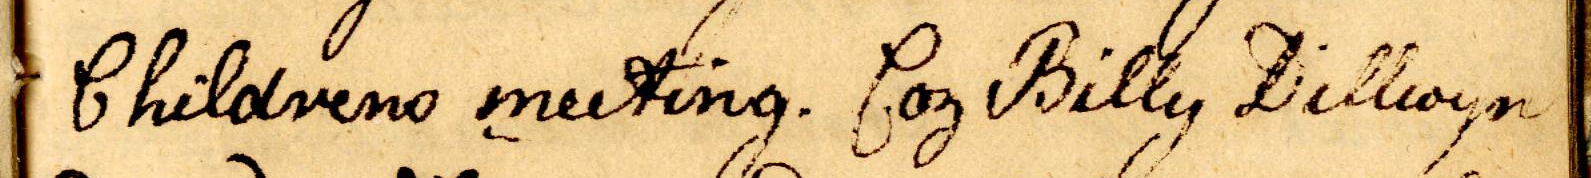Childrens meeting. Coz Billy Dillwyn
